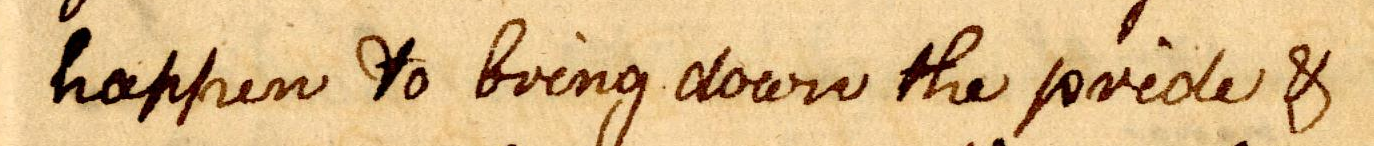happen to bring down the pride &
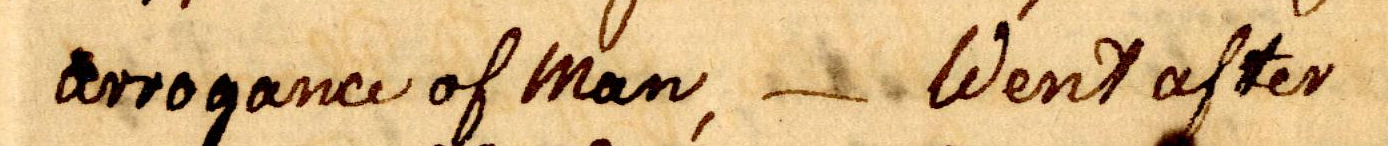arrogance of Man- Went after
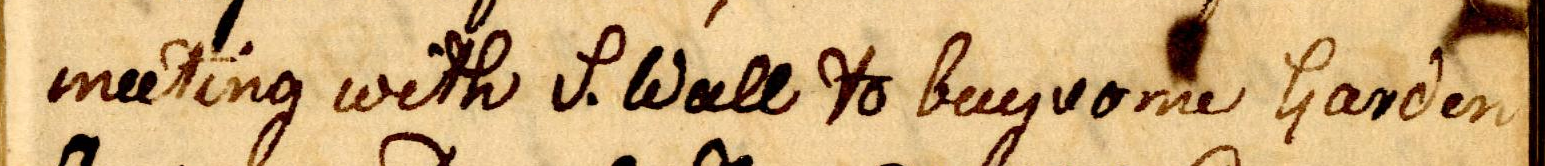meeting with S. Wall to buy some Garden
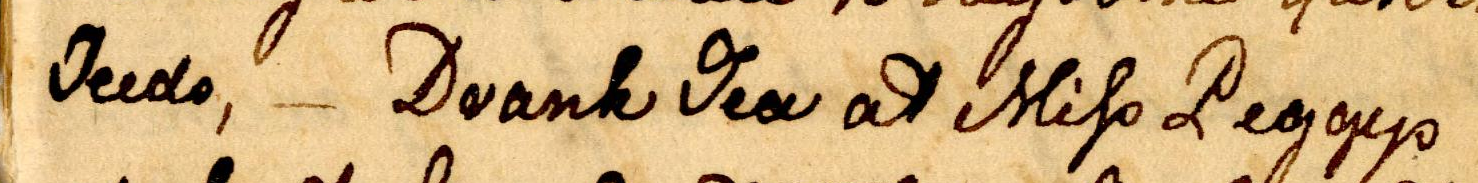Seeds.- Drank Tea at Miss Peggys
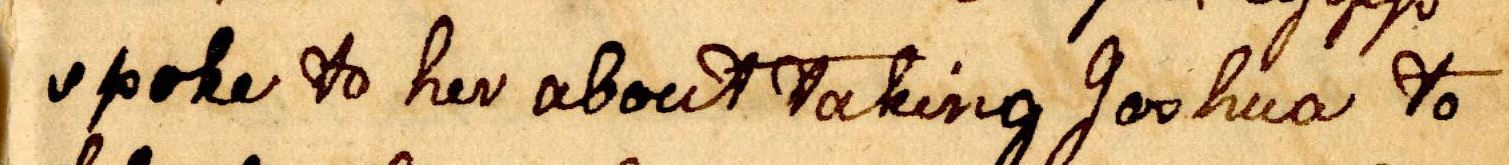spoke to her about taking Joshua to
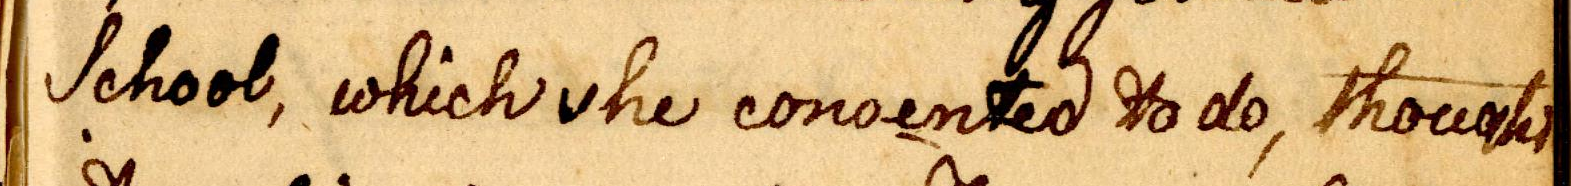School, which she consented to do, thought
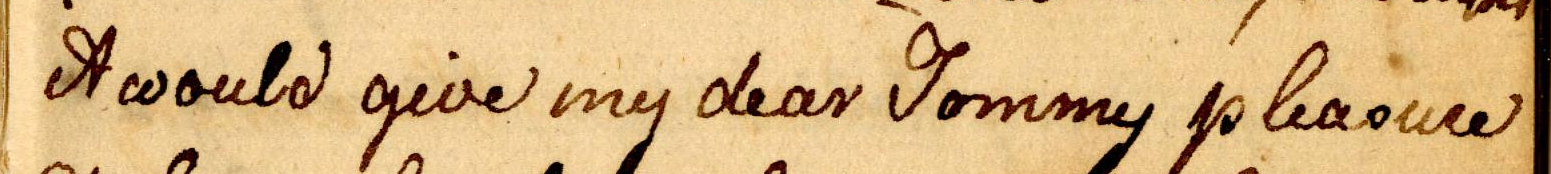it would give my dear Tommy pleasure
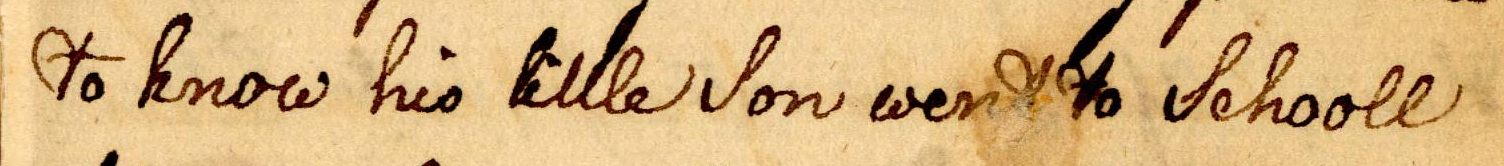to know his little Son went to Schooll
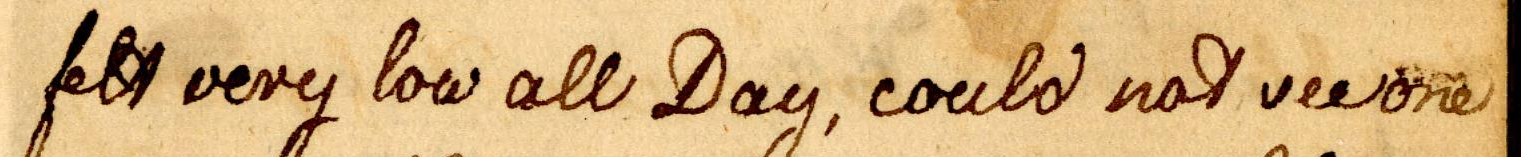felt very low all Day, could not see one
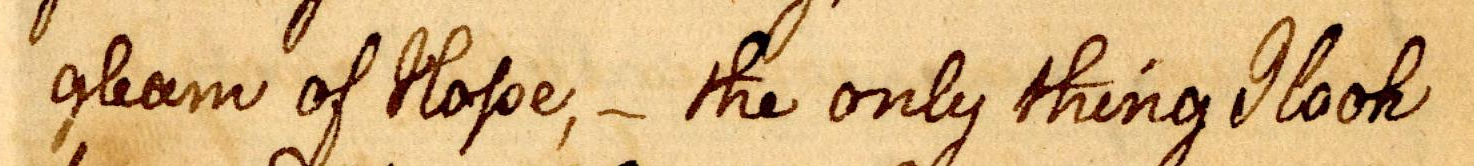gleam of Hope,- the only thing I look
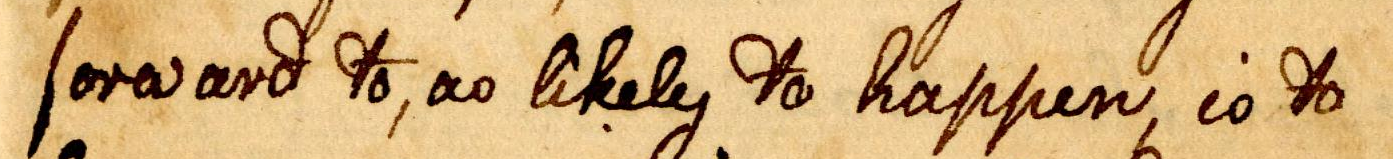forward to, as likely to happen is to
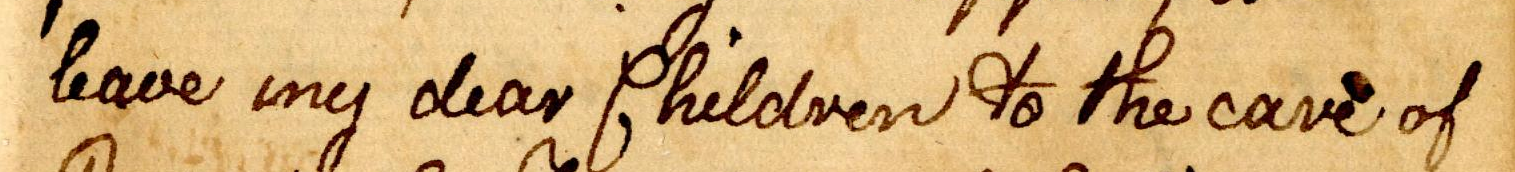leave my dear Children to the care of
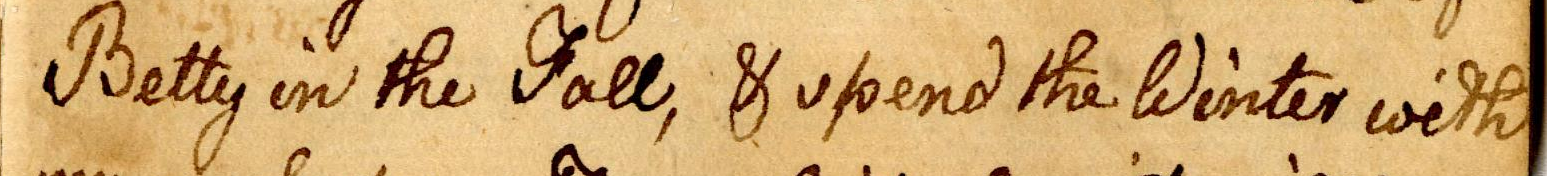Betty in the Fall, & spend the Winter with
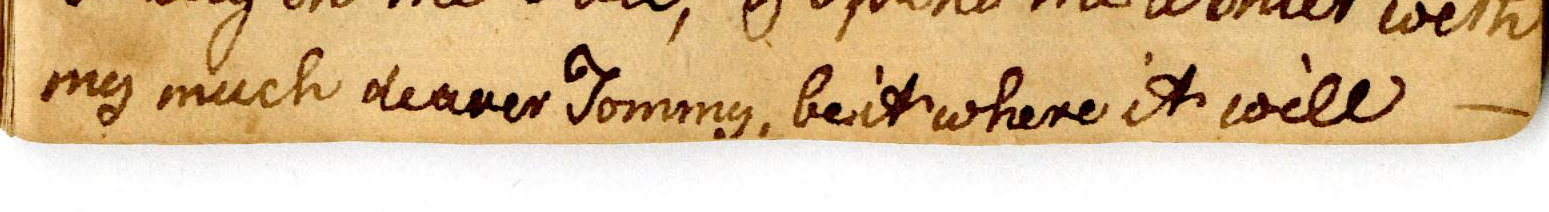my much dearer Tommy, be it where it will
